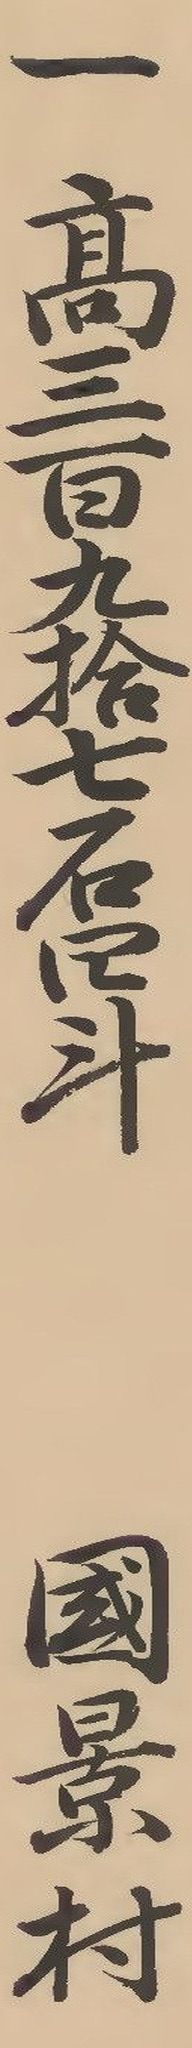一高三百九拾七石四斗国景村

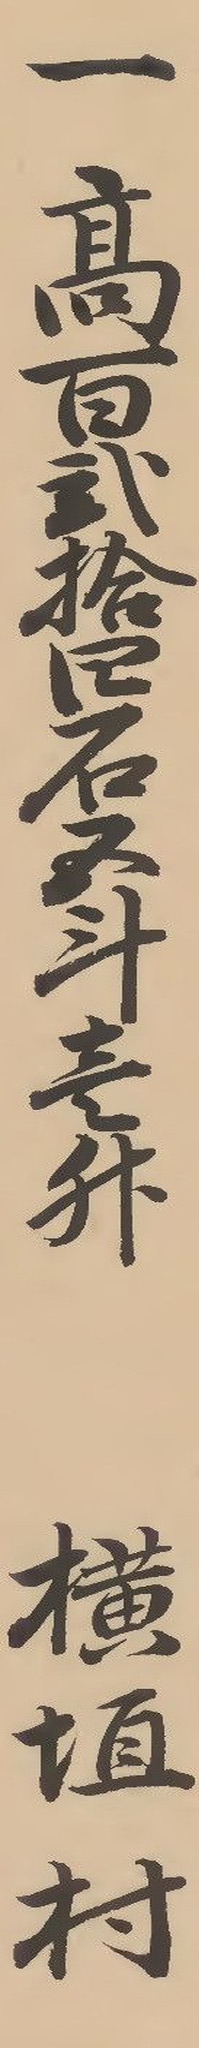一高百弐拾四石五斗壱升横垣村
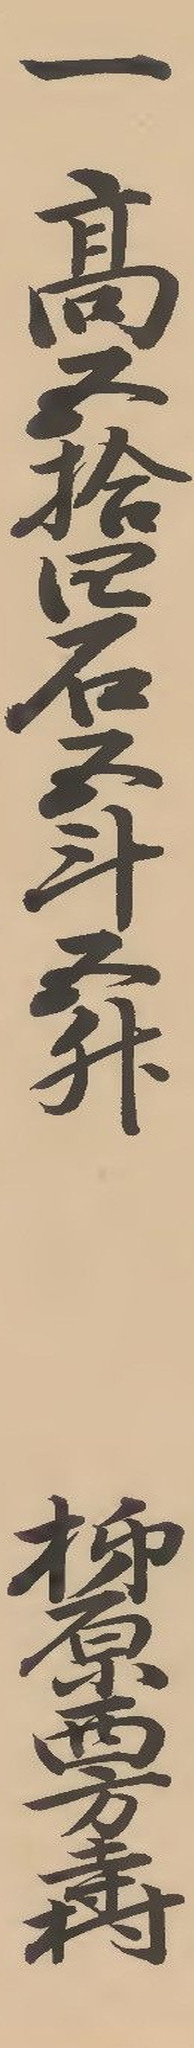一高五拾四石五斗五升柳原西方寺村
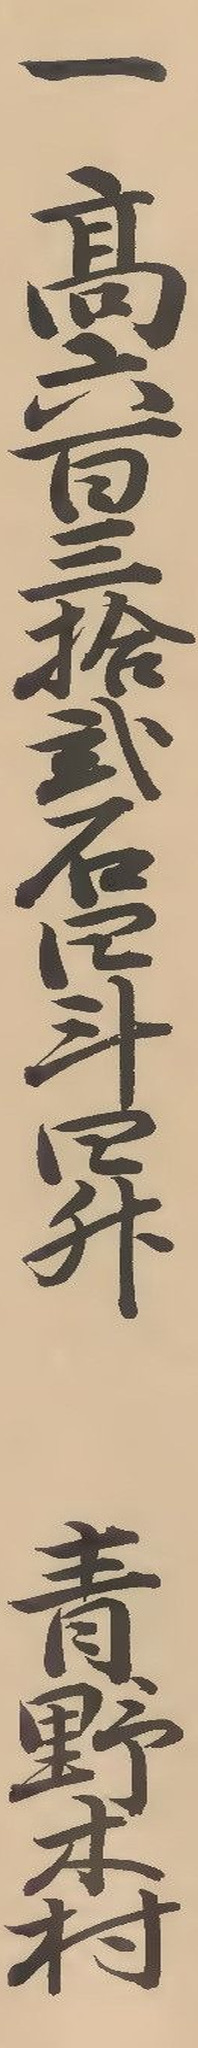一高六百三拾弐石四斗四升青野木村
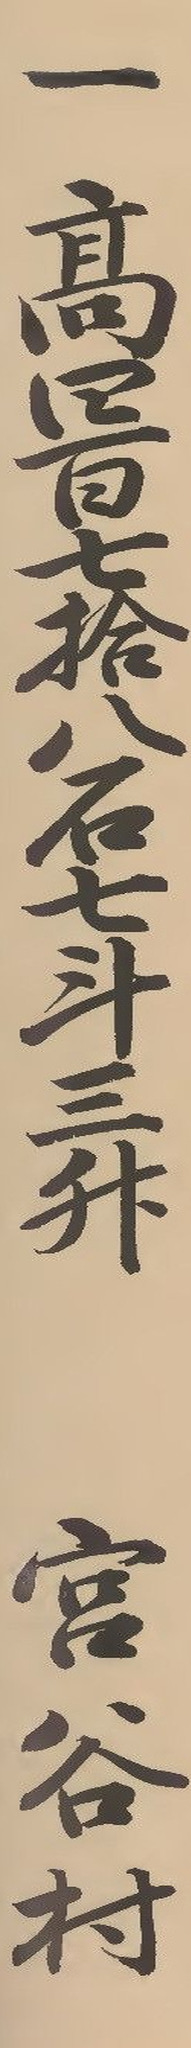一高四百七拾八石七斗三升宮谷村
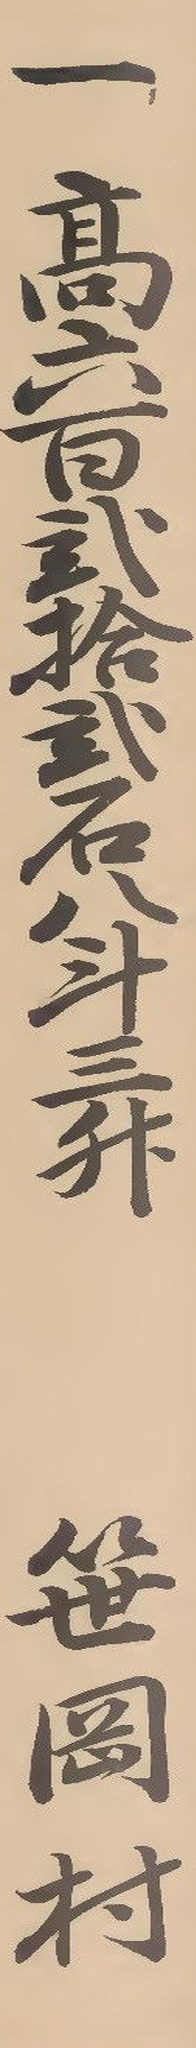一高六百弐拾弐石八斗三升笹岡村
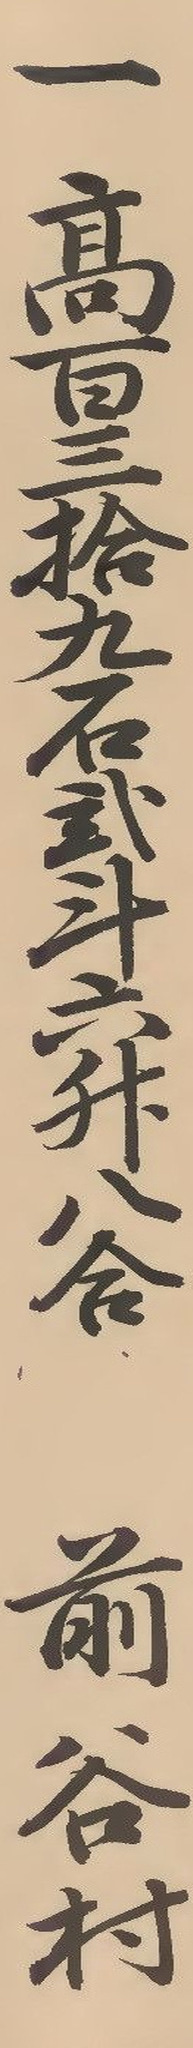一高百三拾九石弐斗六升八合前谷村
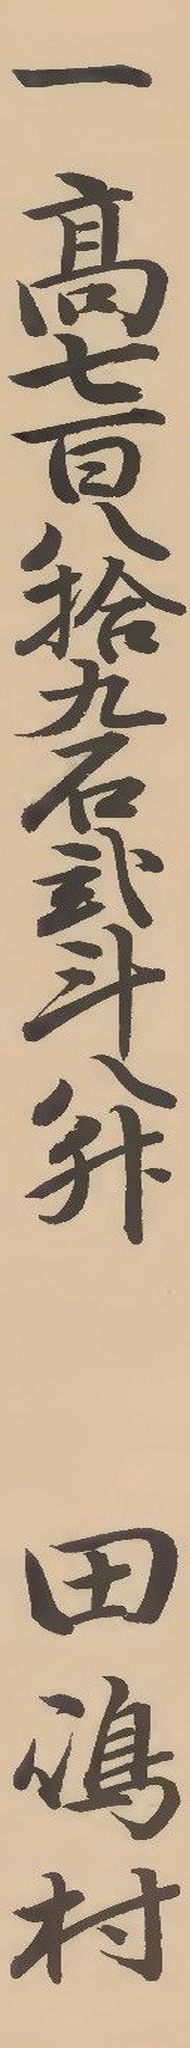一高七百八拾九石弐斗八升田島村
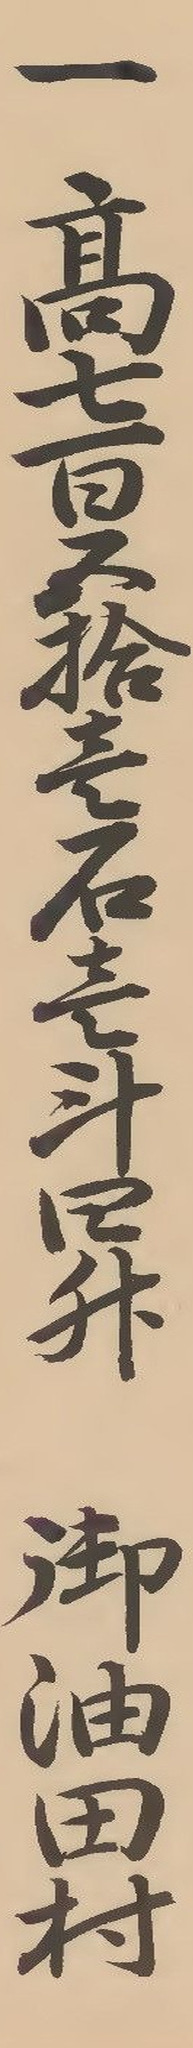一高七百五拾壱石壱斗四升御油田村

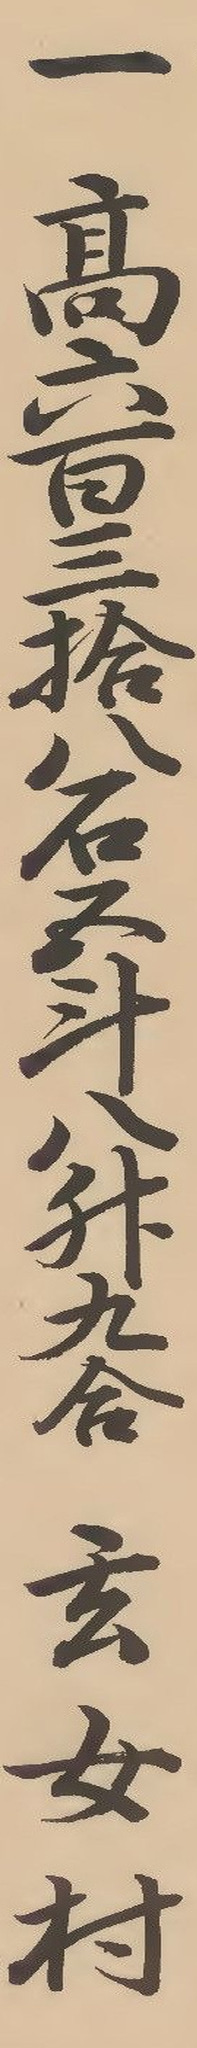一高六百三拾八石五斗八升九合玄女村
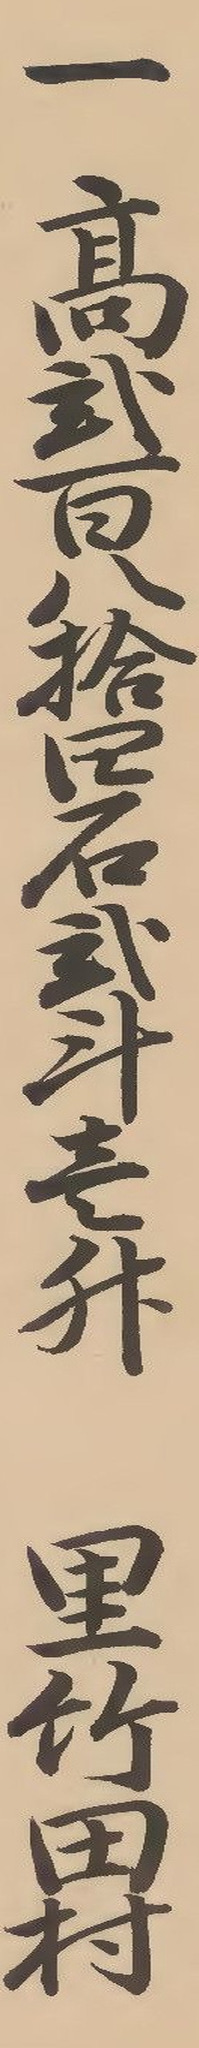一高弐百八拾四石弐斗壱升里竹田村
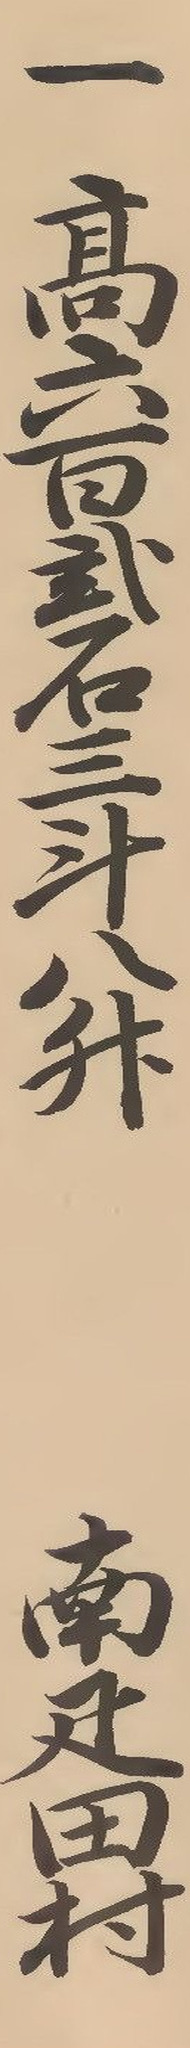一高六百弐石三斗八升南疋田村
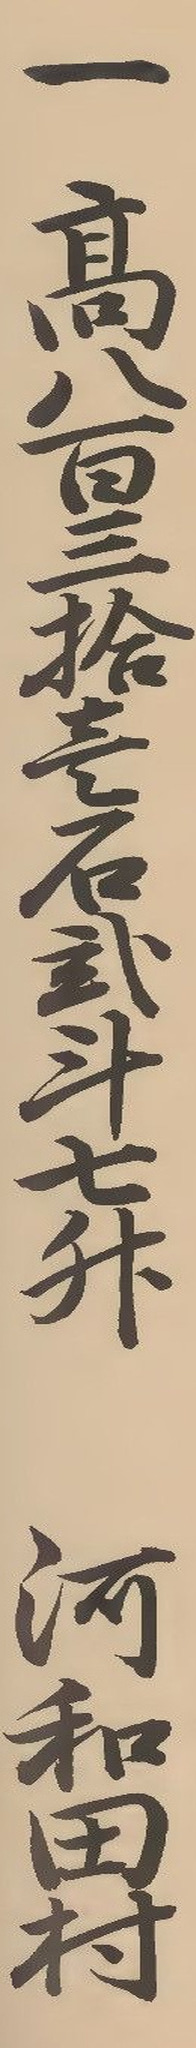一高八百三拾壱石弐斗七升河和田村
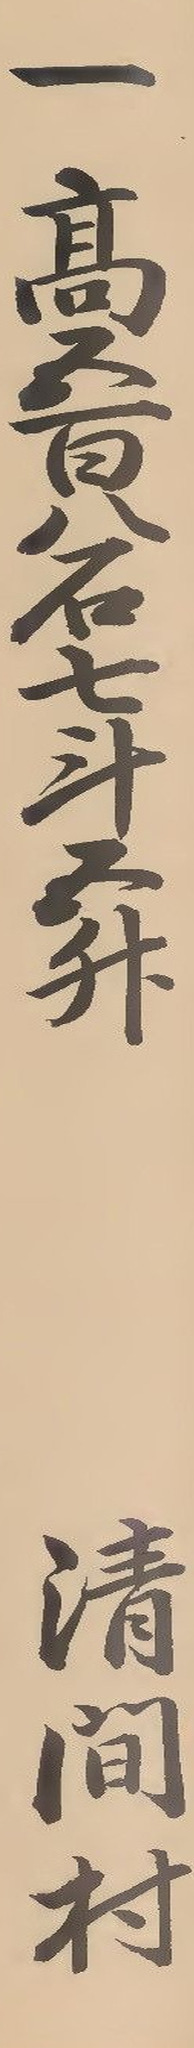一高五百八石七斗五升清間村
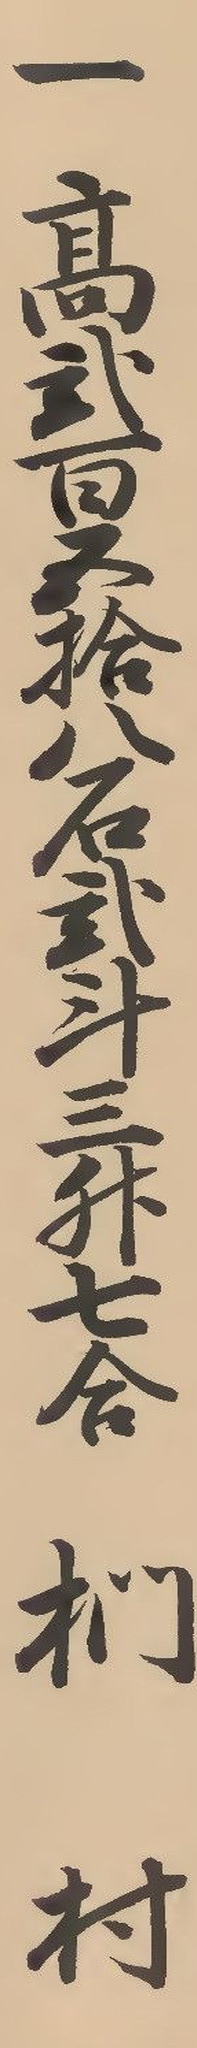一高弐百五拾八石弐斗三升七合椚村
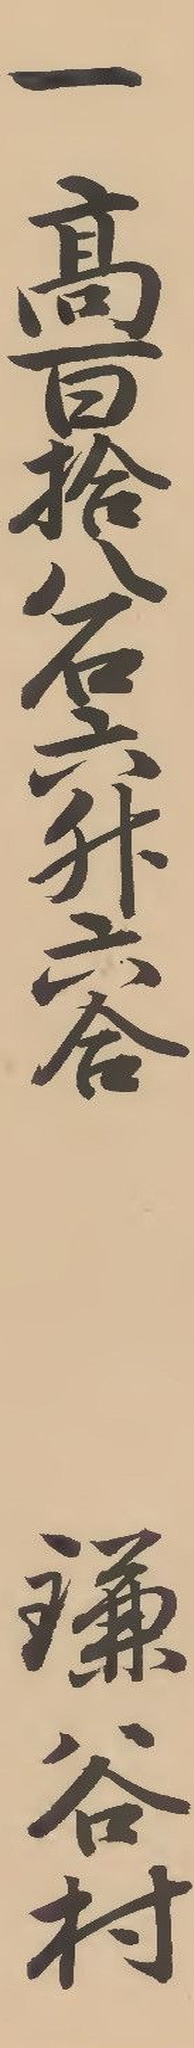一高百拾八石六升六合鎌谷村
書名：越前国郷帳
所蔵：国立公文書館 National Archives of Japan
